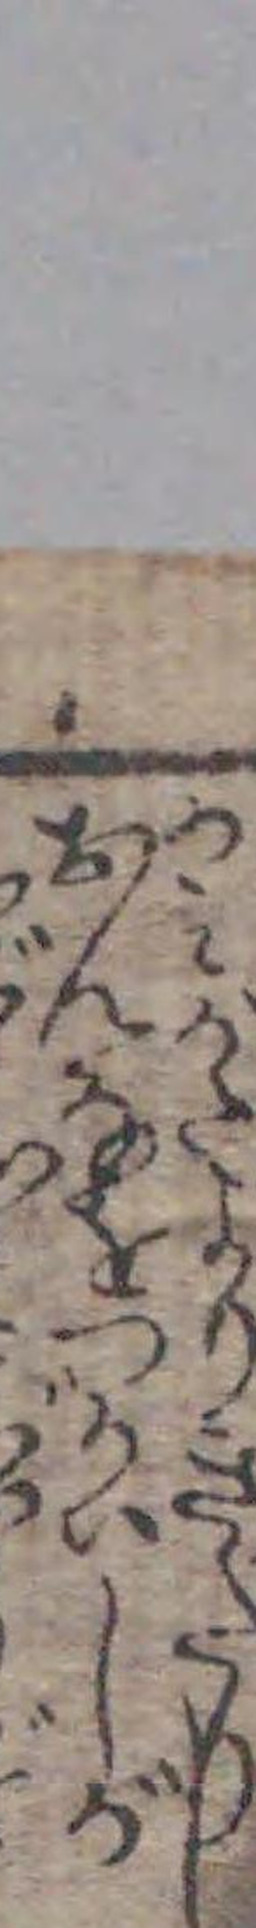おんなをつかいしが
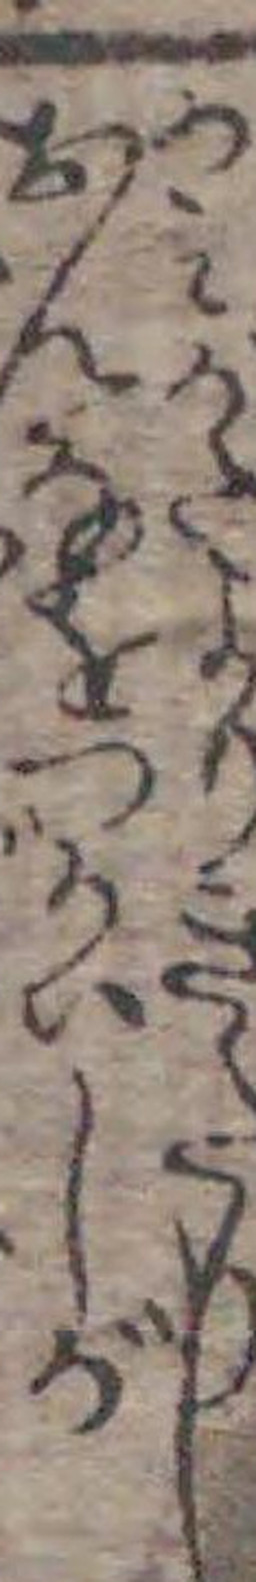おんなをつかいしが
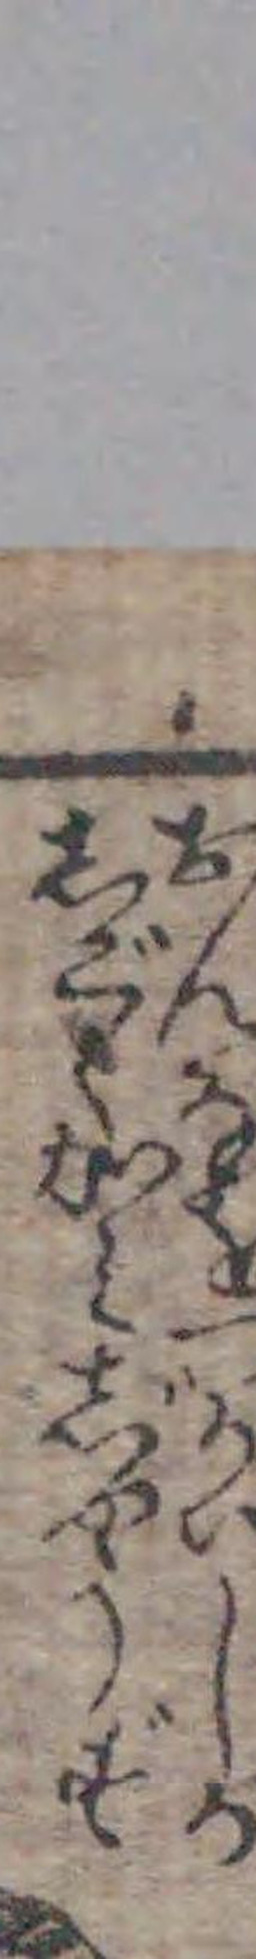しごくかみじやうず
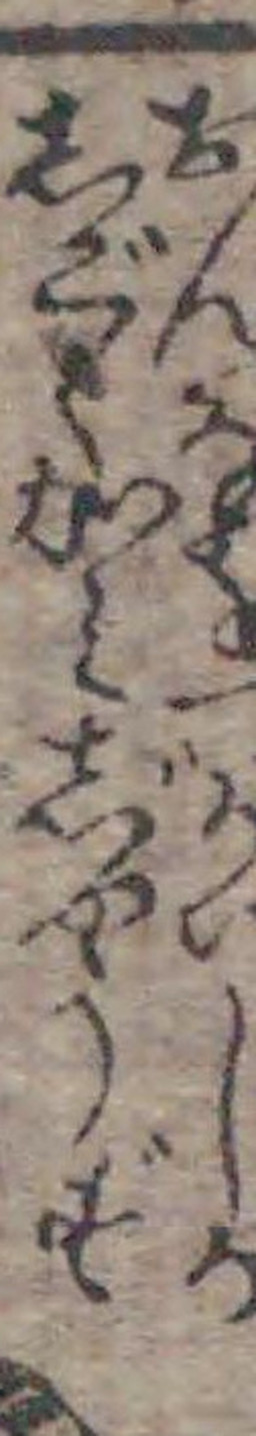しごくかみじやうず
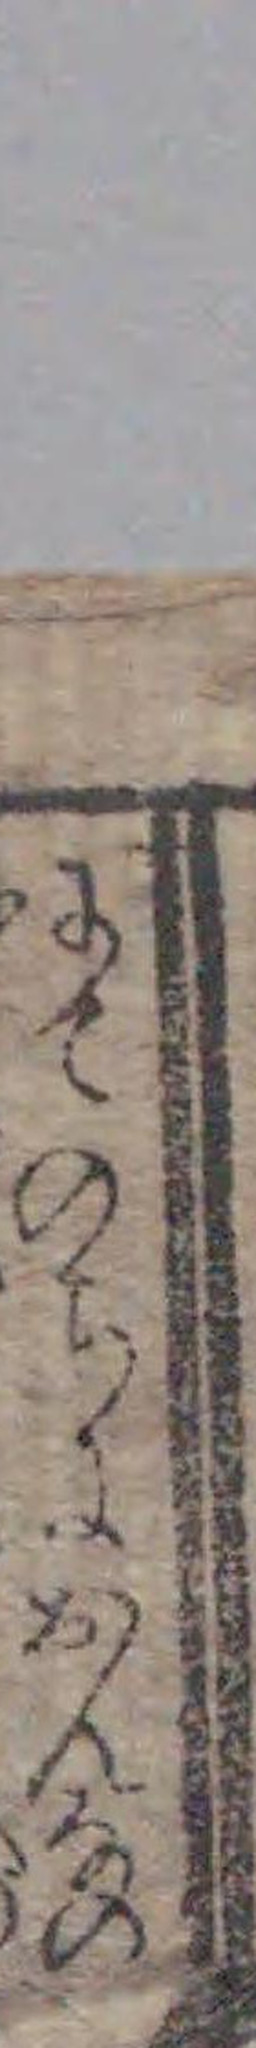にてのちにおんなの
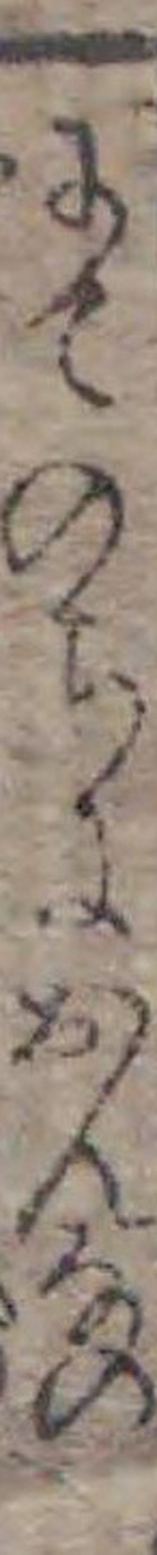にてのちにおんなの
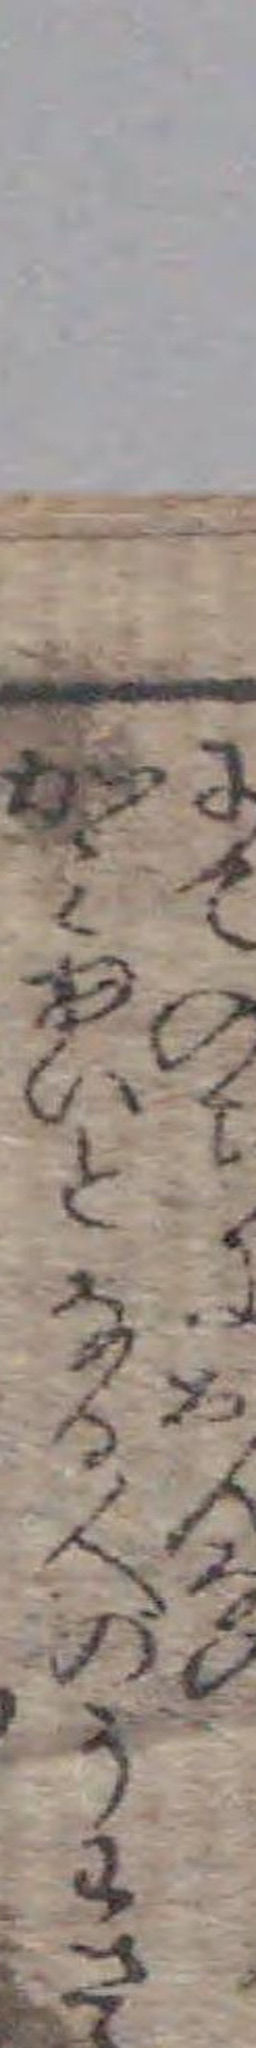かみゆいとなる人のうわさに
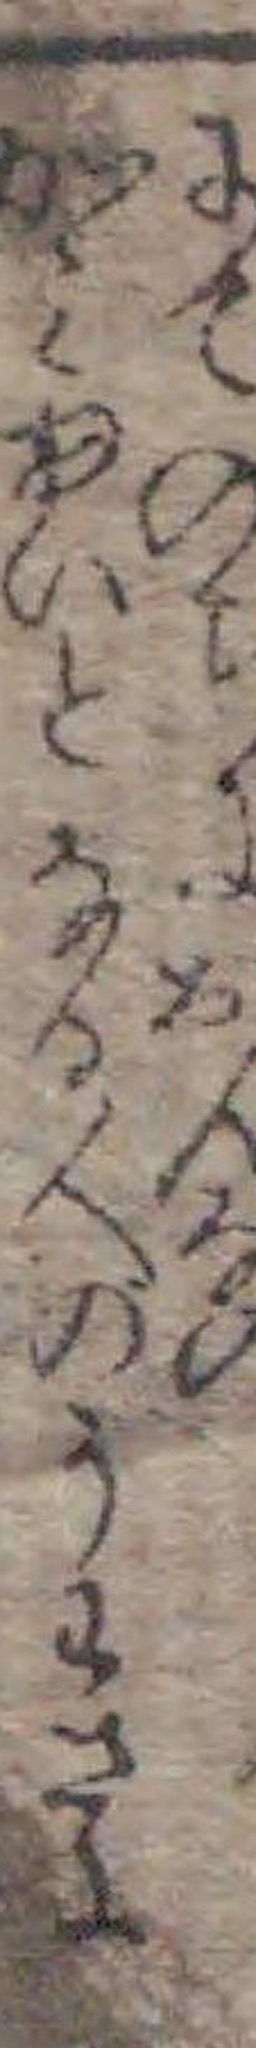かみゆいとなる人のうわさに
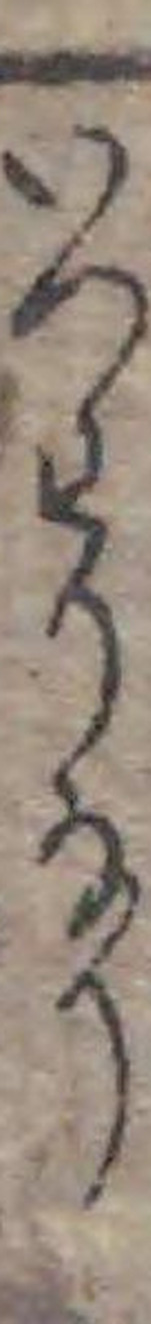いつわりなり
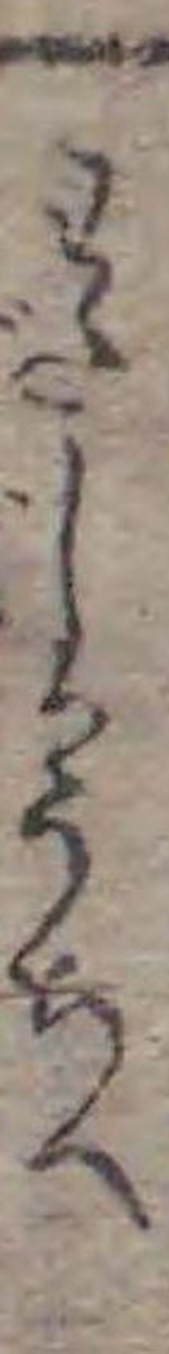わたしかうちへ
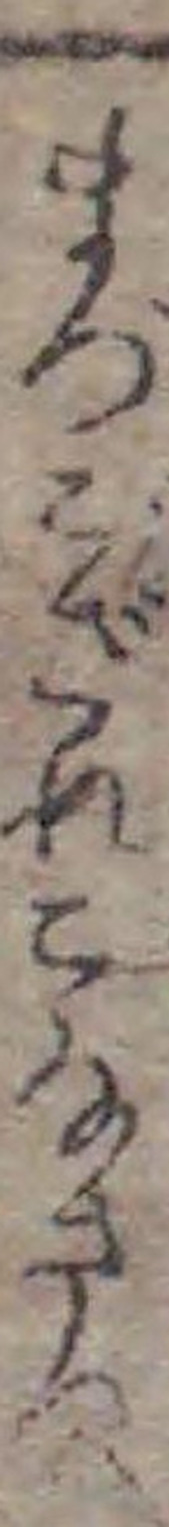まづござれこなさま
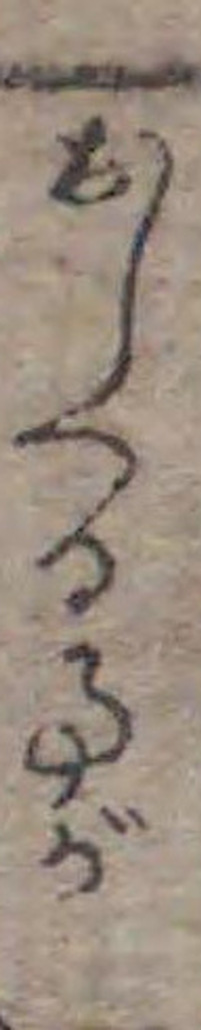おしへる事が
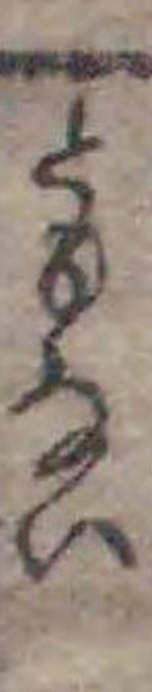ともない
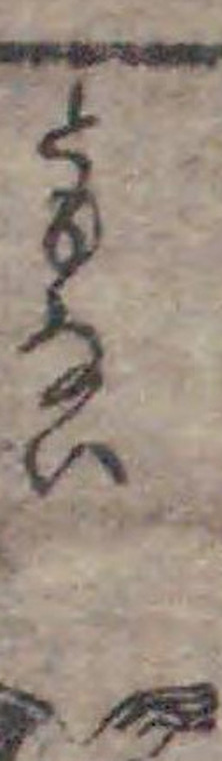ともない
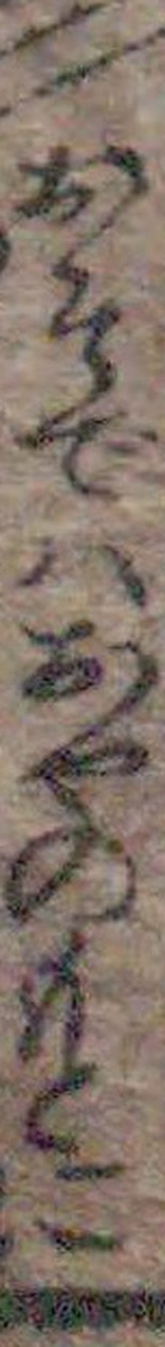おそではおやのもとに
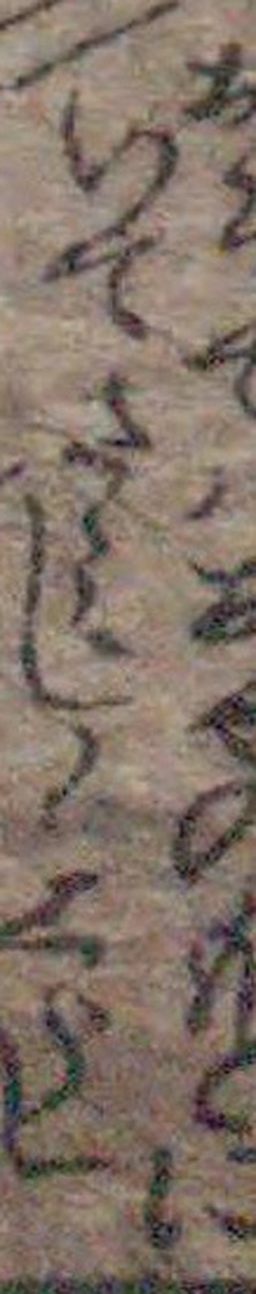いてさみしくくらし
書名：神田与吉一代記 : 3巻
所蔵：国立国会図書館 National Diet Library, JAPAN
